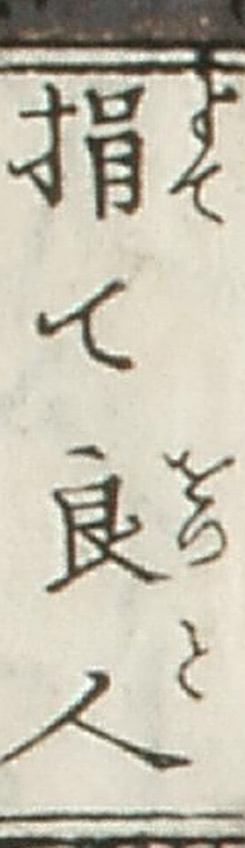捐て良夫
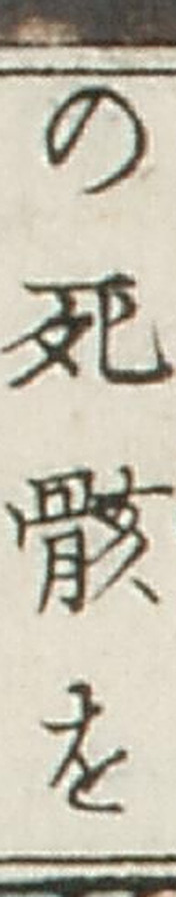の死骸を

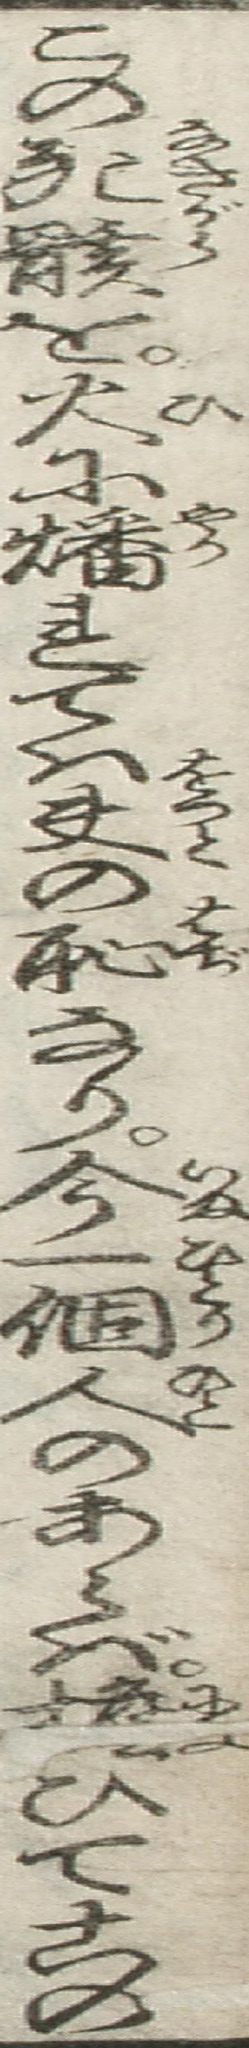この死骸を。火に燔れては夫の恥なり。今一個人のあらば。擔ひてこの
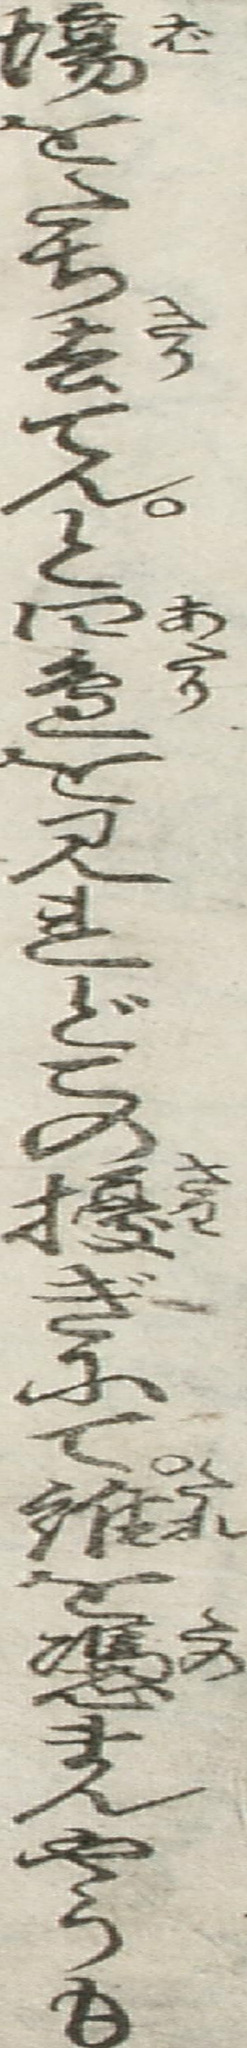場をたち去てん。と四辺を見れどこの擾ぎにて。誰を憑まんやうも
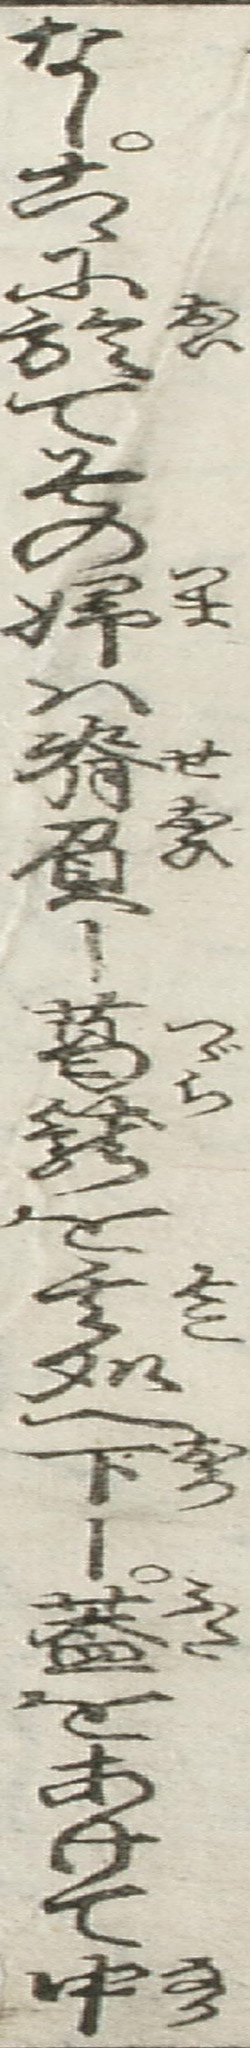なし。こゝに於てその婦は背負し葛籠を其処へ下し。蓋をあけて中
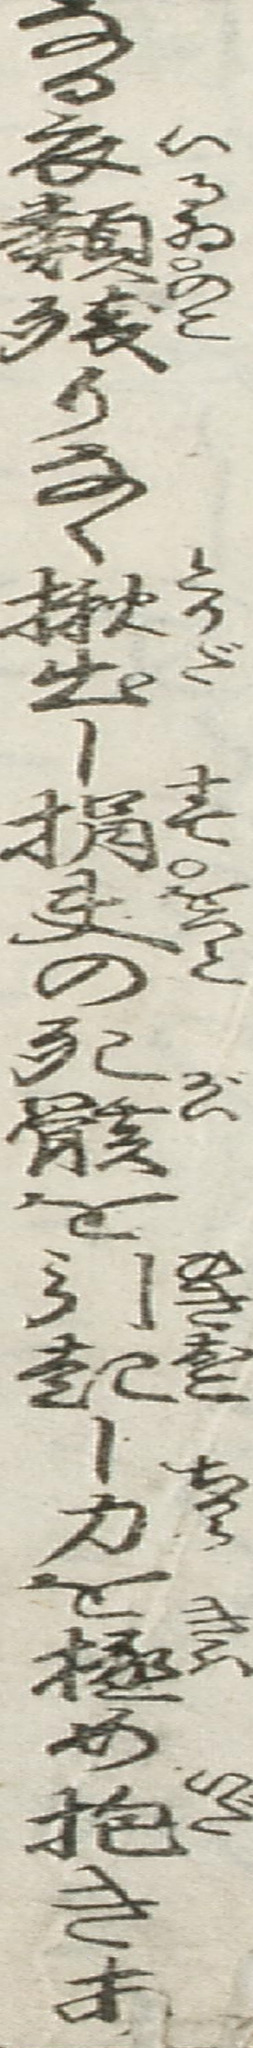なる衣類。残なく揪出し捐。夫の死骸を引起し力を極め抱きあ
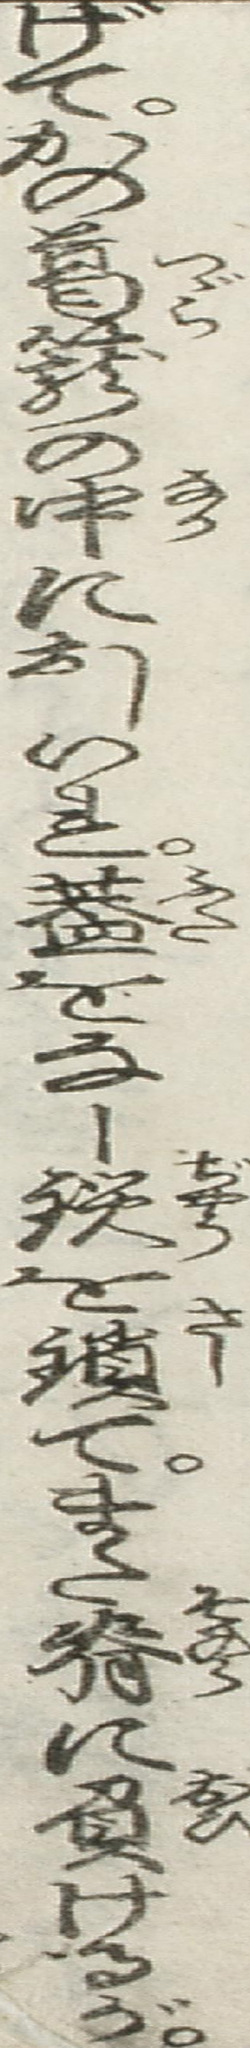げて。かの葛籠の中におしいれ。蓋をなし鎖を鎖て。また背に負けるが。
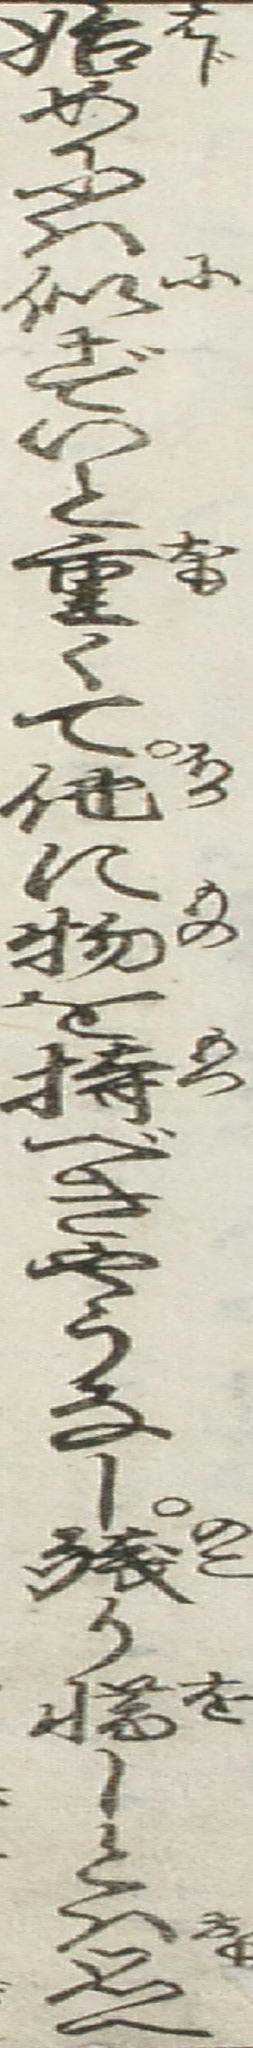始めには似ずいと重くて。他に物を持べきやうなし。残り惜しとは思へ
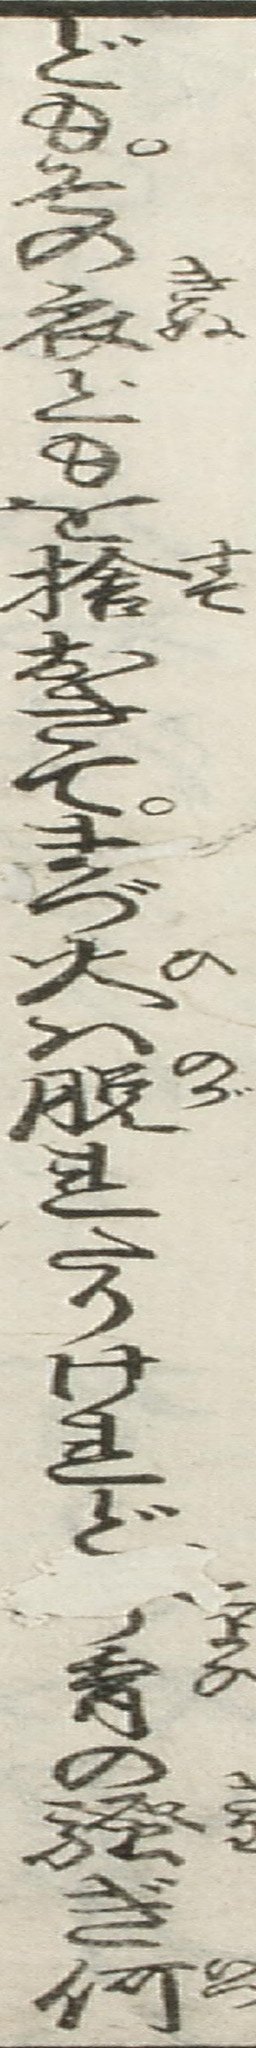ども。その衣ともを捨おきて。まづ火は脱れたりけれど。今宵の騒ぎ何
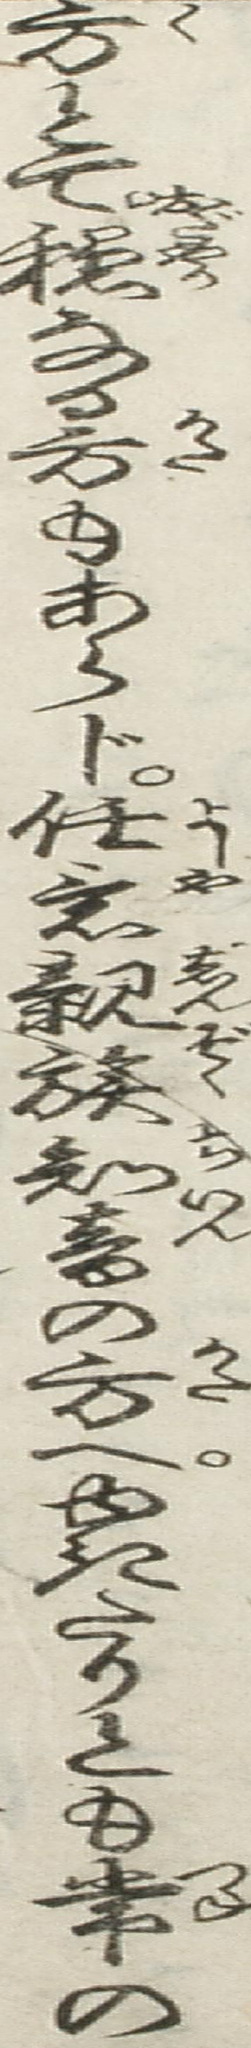方とて。穏なる方もあらじ。任意親族知音の方へゆきたりとも常の
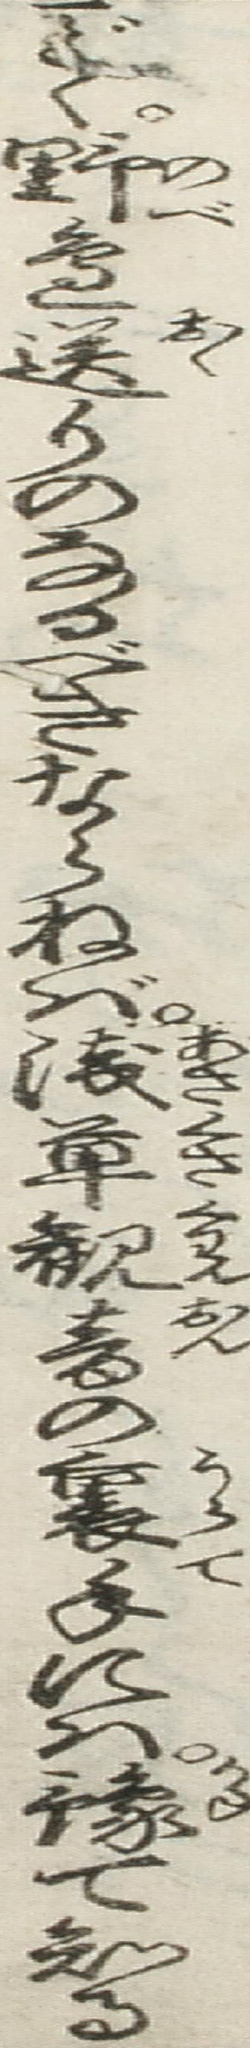ごとく。野辺送りのなるべきならねば。浅草観音の裏手には。豫て知る
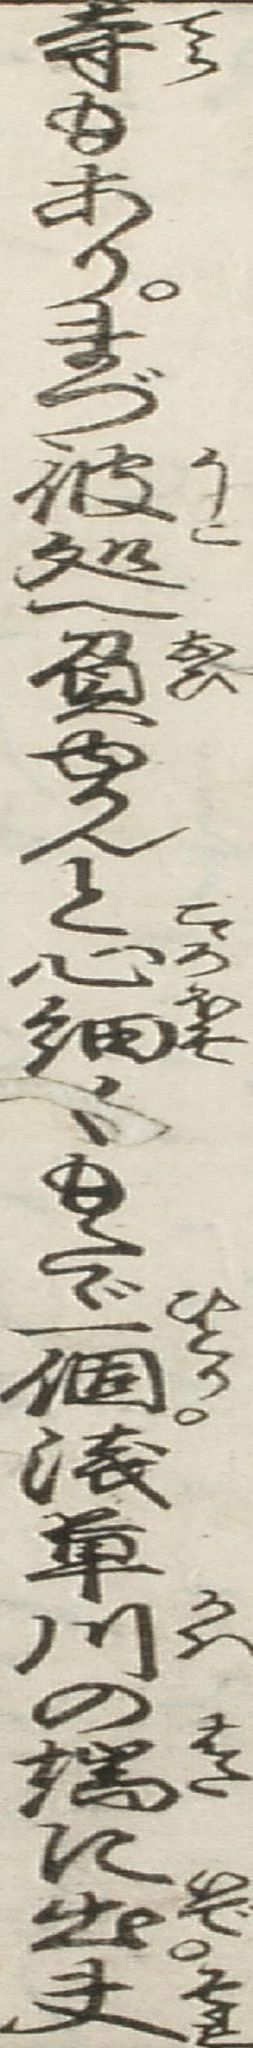寺もあり。まづ彼処へ負ゆかんと心細くもたゞ一個。浅草川の端に出。夫
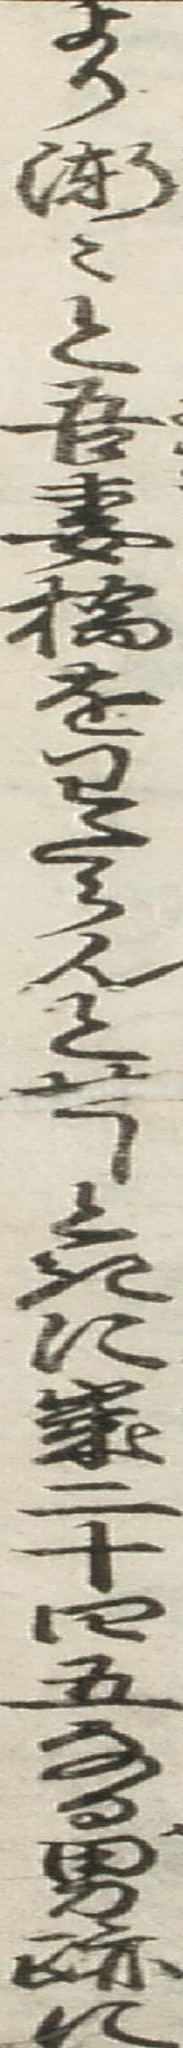より漸々と吾妻橋をわたらんとせしときに。歳二十四五なる男跡に
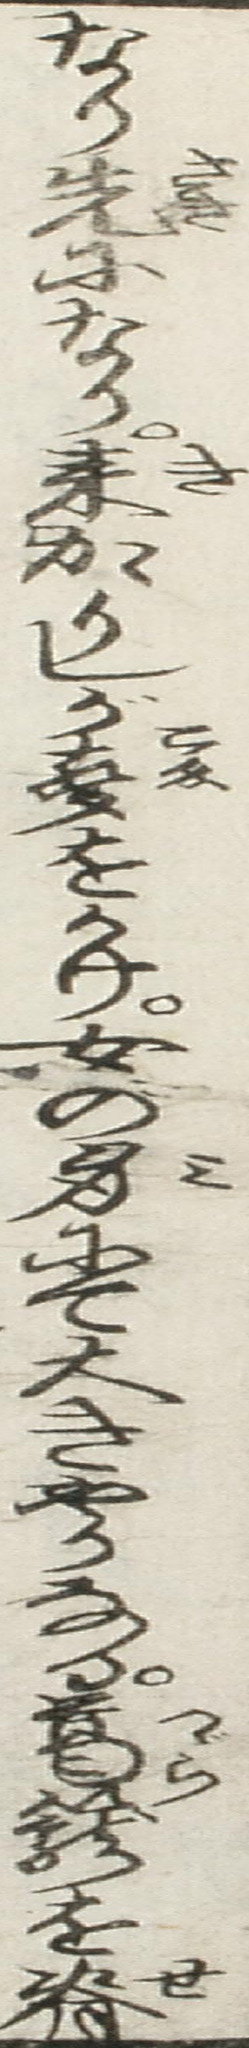なり先になり。来かゝりしが声をかけ。女の身にて大きやかなる。葛籠を背
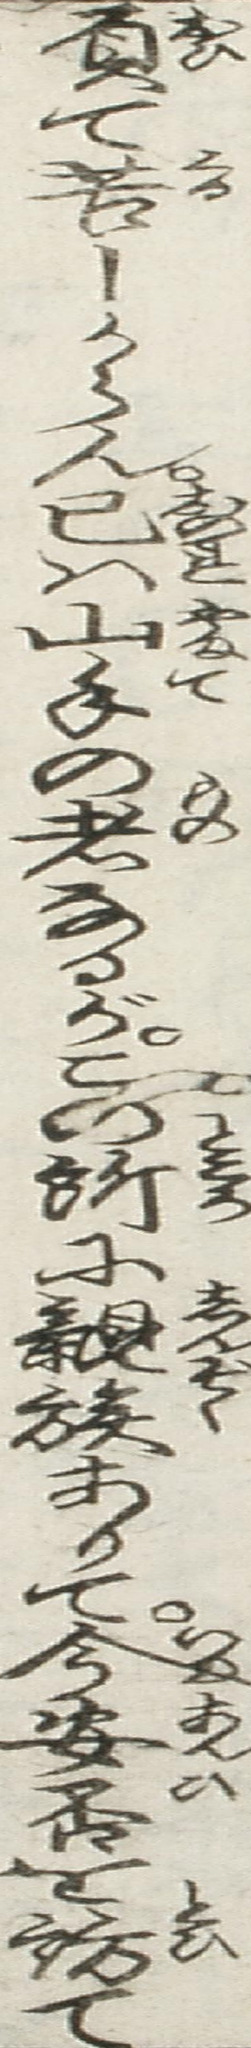負て苦しからん。己は山手の者なるが。この所に親族ありて。今安否を訪て
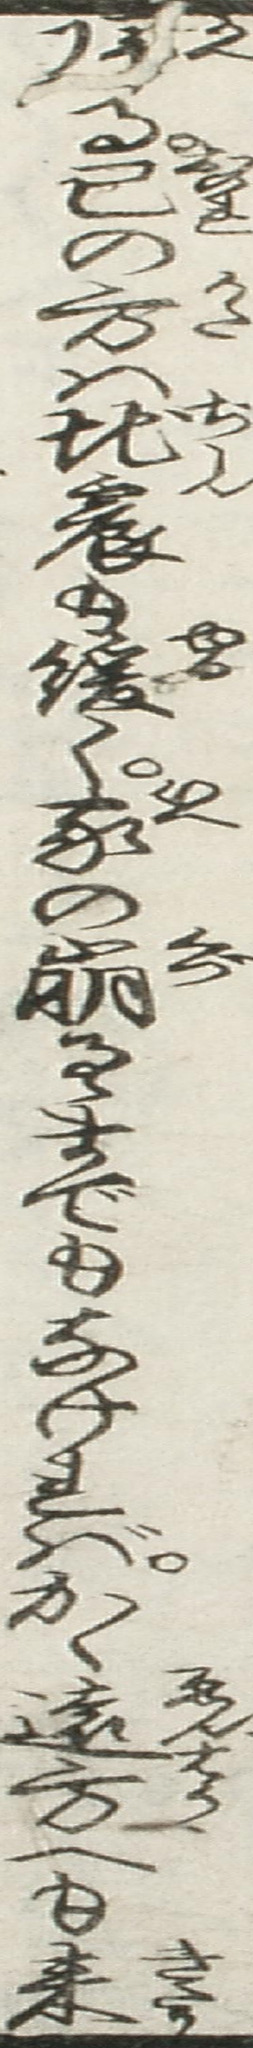帰る。己の方は地震も緩く。家の崩るゝまでもなければ。かく遠方へも来
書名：安政見聞録　下
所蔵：東京大学地震研究所図書室 Earthquake Research Institute Library, The University of Tokyo, JAPAN
